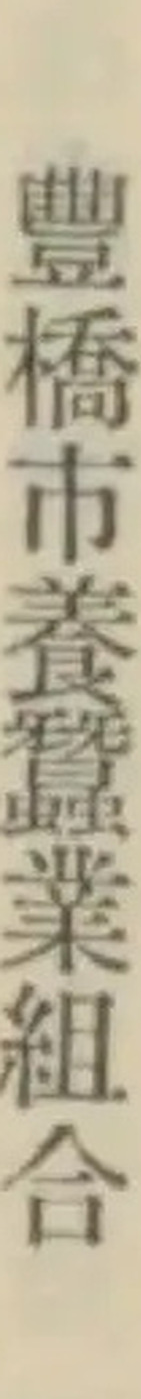豊橋市養蚕業組合
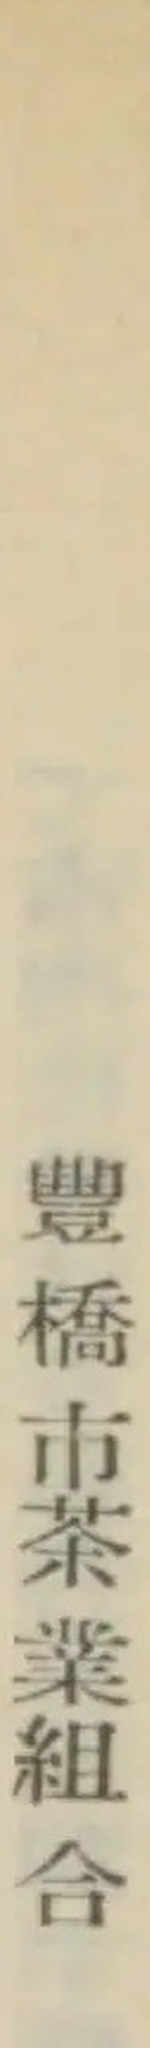豊橋市茶業組合
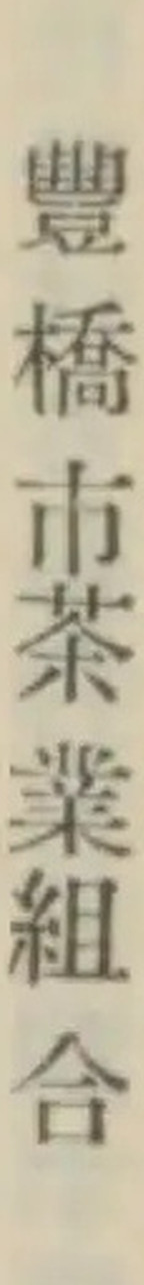豊橋市茶業組合
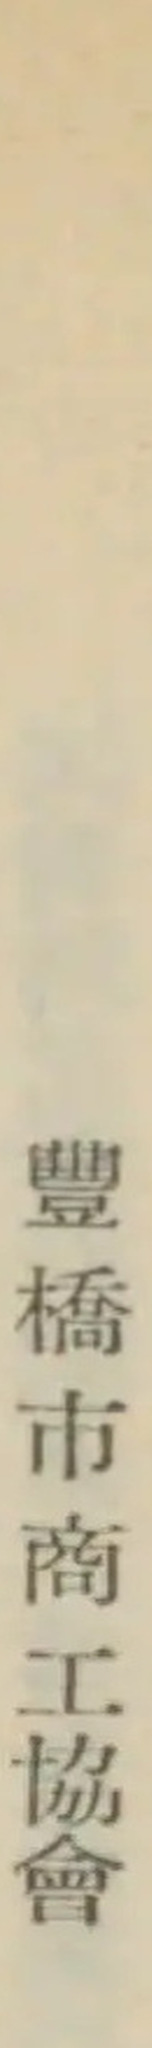豊橋市商工協会
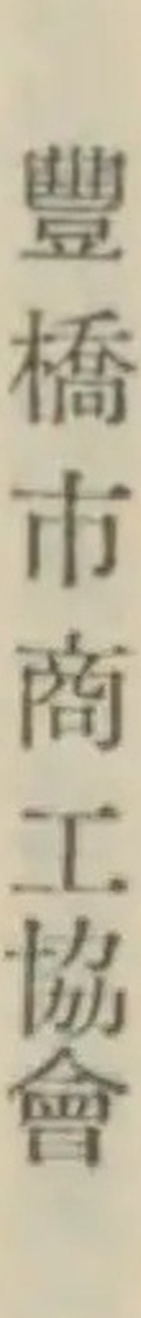豊橋市商工協会
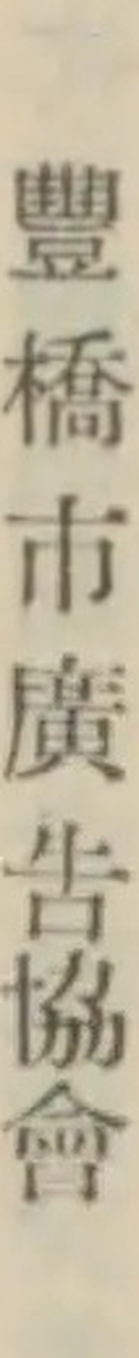豊橋市広告協会
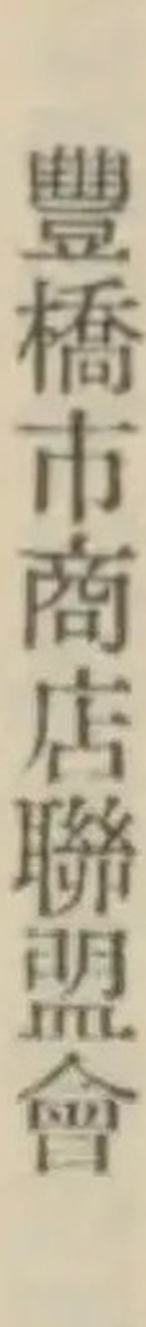豊橋市商店聯盟会
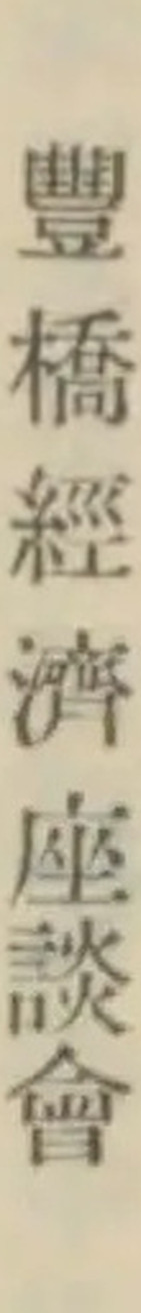豊橋経済座談会
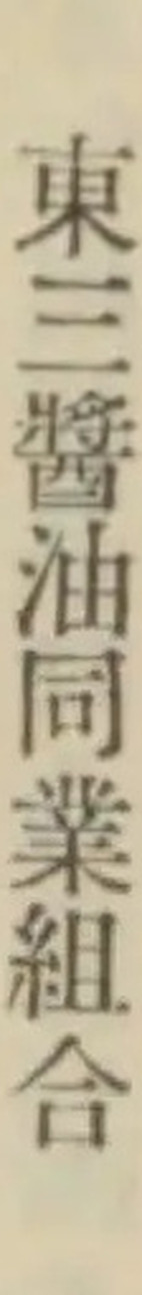東三醤油同業組合
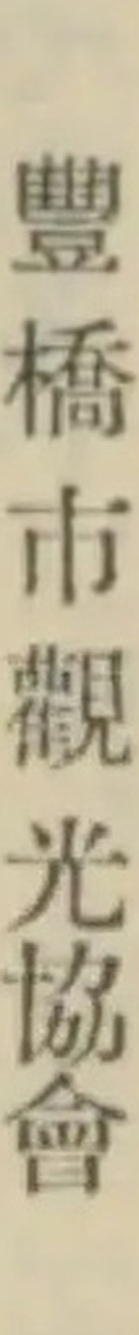豊橋市観光協会
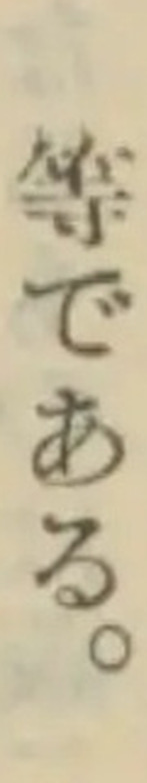等である。
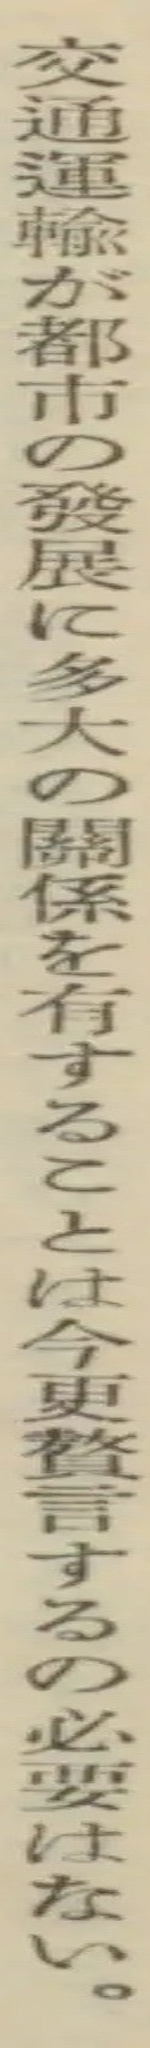交通運輸が都市の発展に多大の関係を有することは今更贅言するの必要はない。
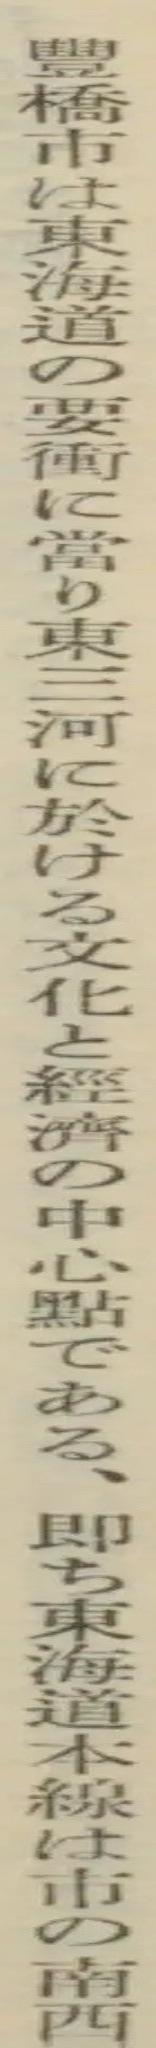豊橋市は東海道の要衝に当り東三河に於ける文化と経済の中心点である、即ち東海道本線は市の南西
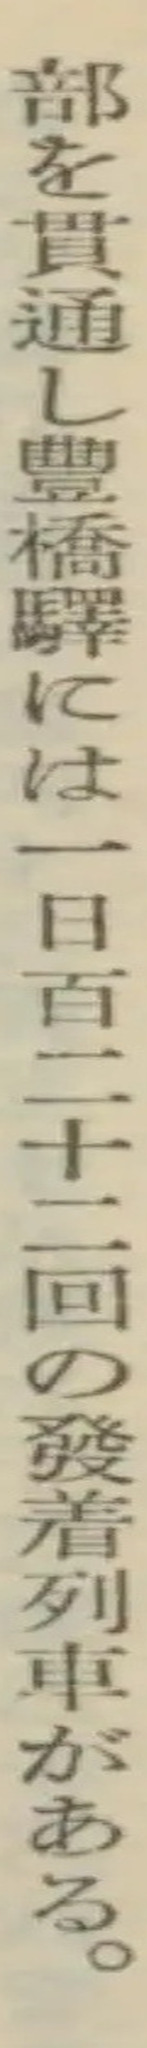部を貫通し豊橋駅には一日百二十二回の発着列車がある。
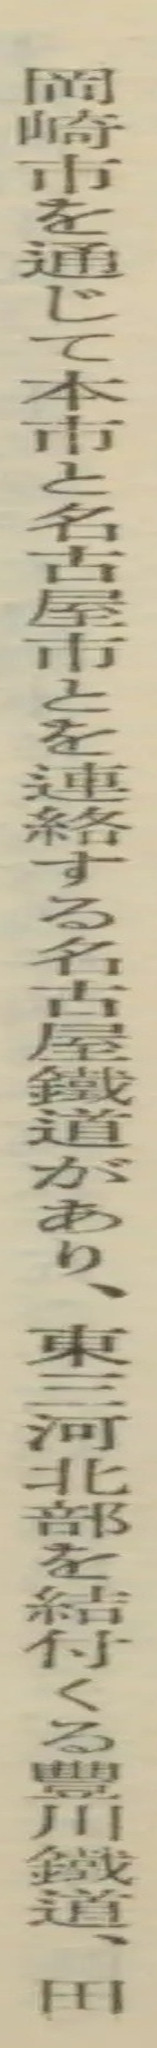岡崎市を通じて本市と名古屋市とを連絡する名古屋鉄道があり、東三河北部を結付くる豊川鉄道、田
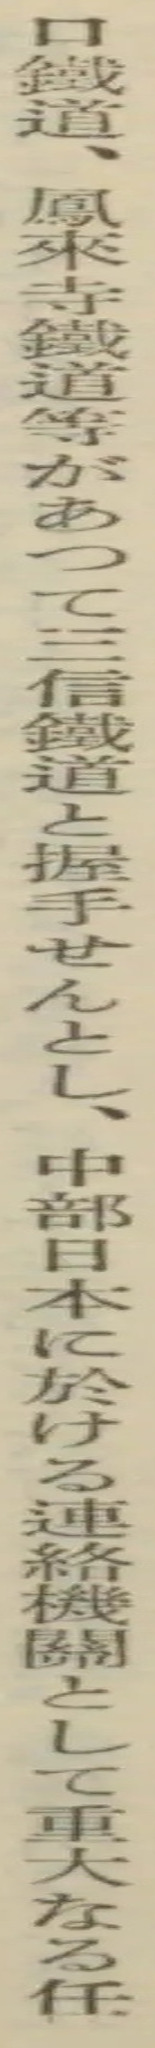口鉄道、鳳来寺鉄道等があつて三信鉄道と握手せんとし、中部日本に於ける連絡機関として重大なる任
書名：産業の豊橋
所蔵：国立国会図書館 National Diet Library, JAPAN
